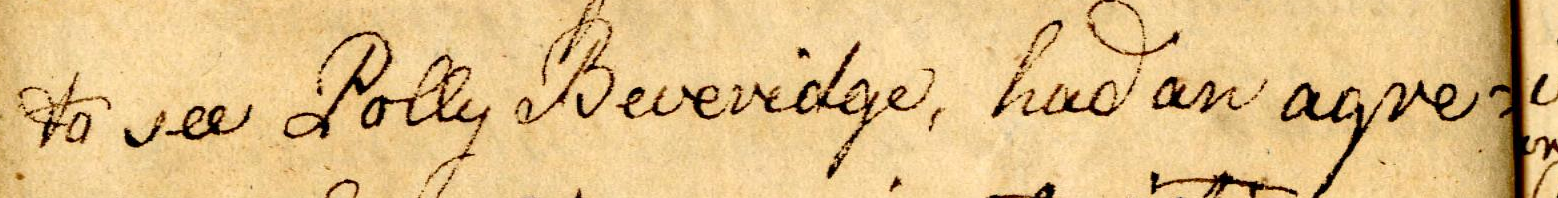to see Polly Beveridge, had an agre-
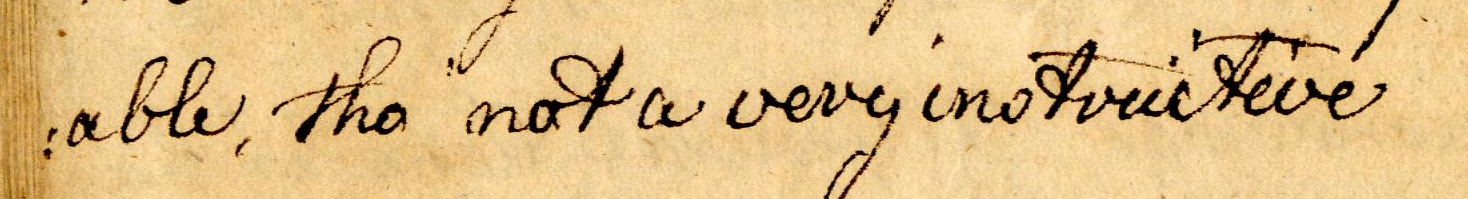-able , tho not a very instructive
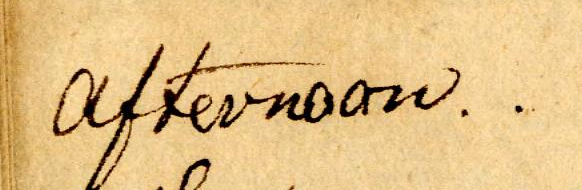Afternoon..
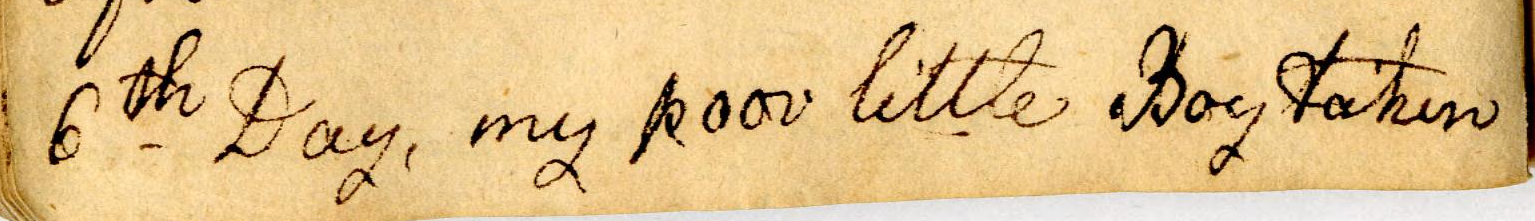6^th Day, my poor little Boy taken
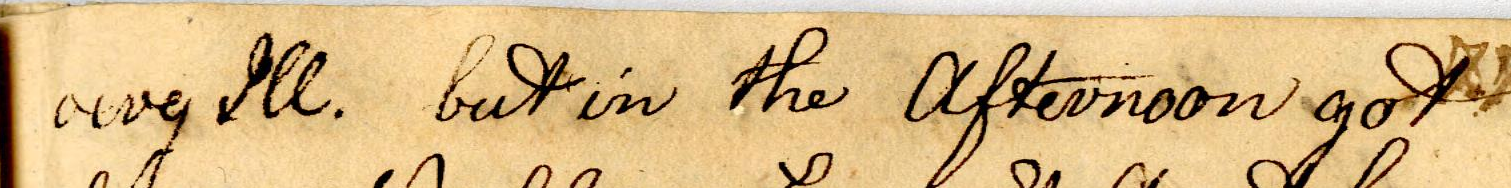very Ill. but in the Afternoon got ^77
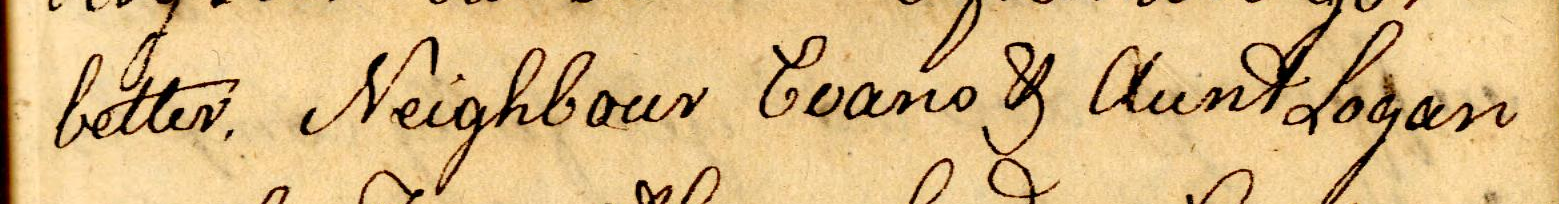better, Neighbor Evans & Aunt Logan
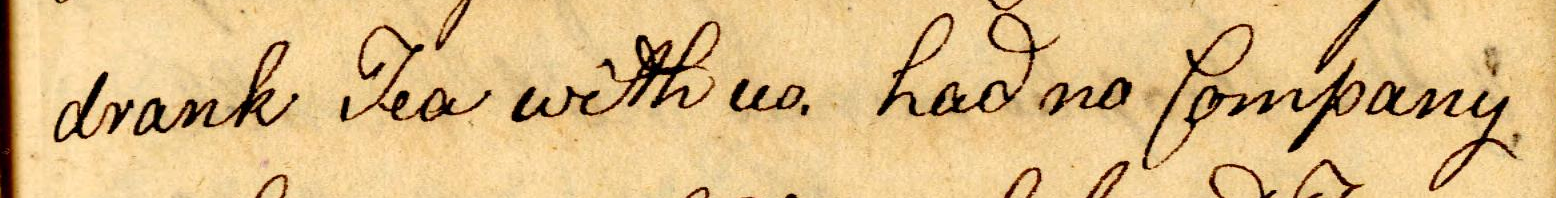drank Tea with us. had no Company
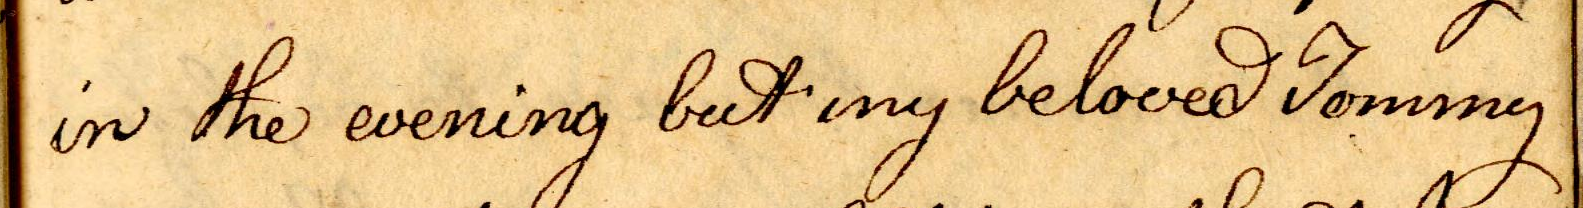in the evening but my beloved Tommy
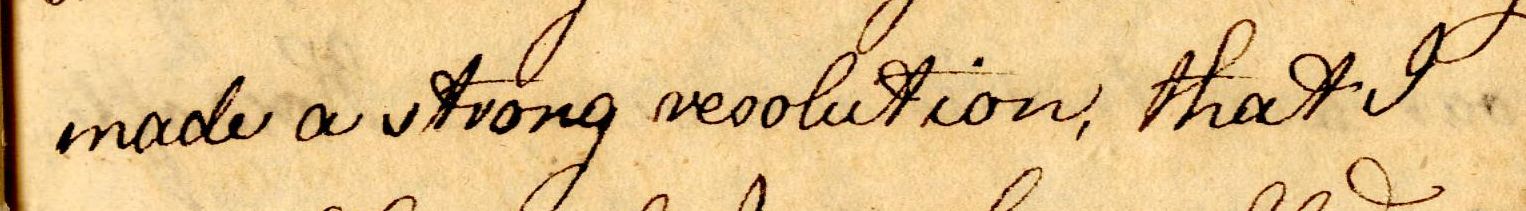made a strong resolution, that I
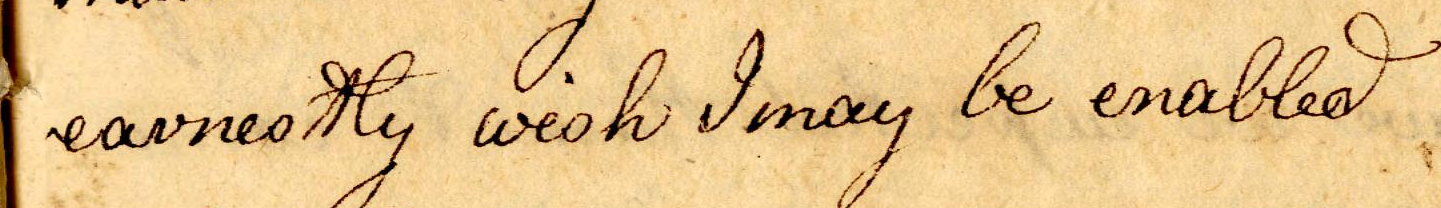earnestly wish I may be enabled
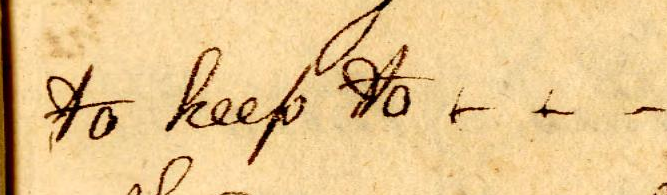to keep to-
